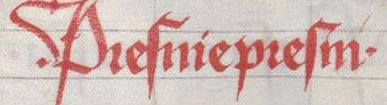Pieſnie pieſní.
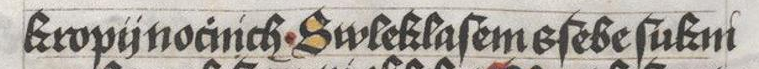kropíj noċních.Swlekla ſem sſebe ſukni
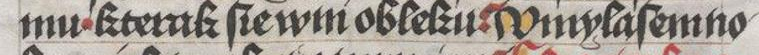mu. kterak ſie wní obleku?Vmylaſem no¬
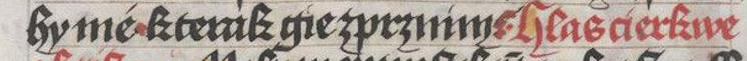hy mé.kterak gíe zprzním? Hlas cíerkwe
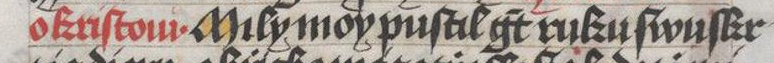oktiſtoui. Mily moy puſtil ḡt ruku ſwuſkr¬
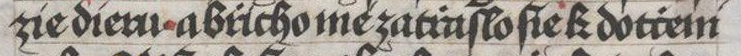zie díeru. a bṙicho mé zatṙaſlo ſie k dotċení
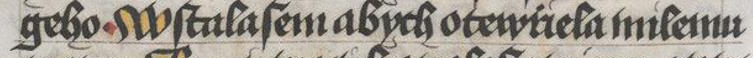geho. Wſtala ſem abych otewṙiela milemu
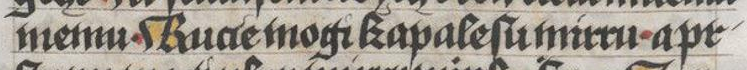memu.Rucie mogi kapaleſu mirru. a pr¬
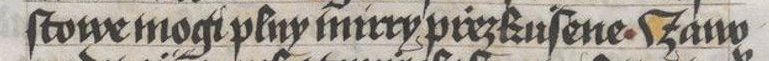ſtowe mogi plny mirry pṙezkuẛene.Zawo¬
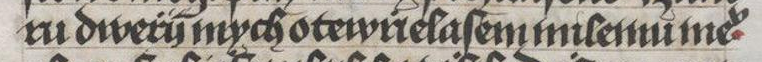ru dweṙij mych otewṙielaſem milemu mev
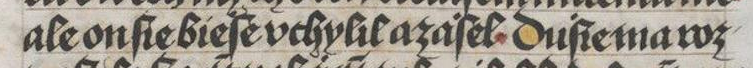ale on ſie bieẛe vchylil a zaẛel.Duẛiema roz¬
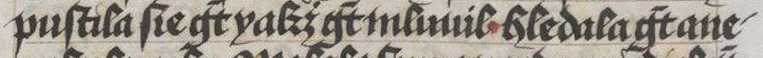puſtila ſie ḡt yakż ḡt mluuil. hledala ḡt ane¬
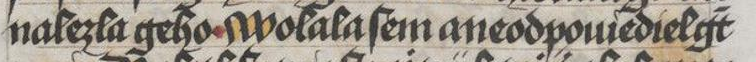nalezla geho.Wolala ſem a neodpoviedíel ḡt
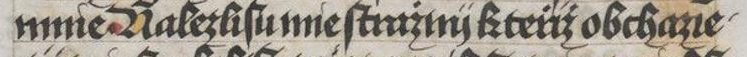mnie. Nalezliſu mie ſtrażníj kteṙíż obchazie¬
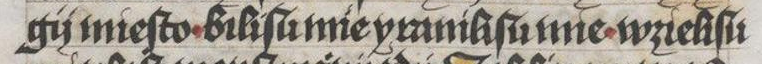gíj mieſto.biliſu míe y raniliſu mie.wzielilſu
